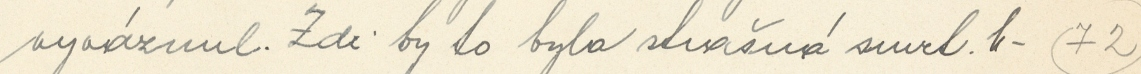vyváznul. Zde by to byla strašná smrt. U- (72)
